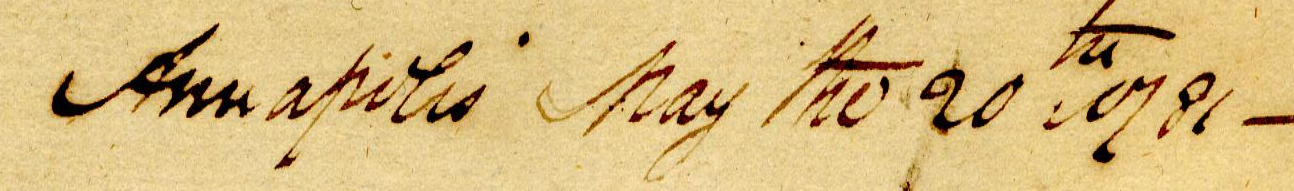Annapolis May the 20^th. 1781.
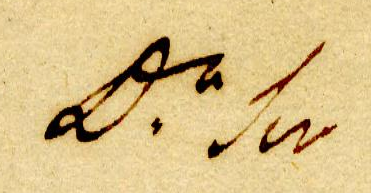D^r. Sir
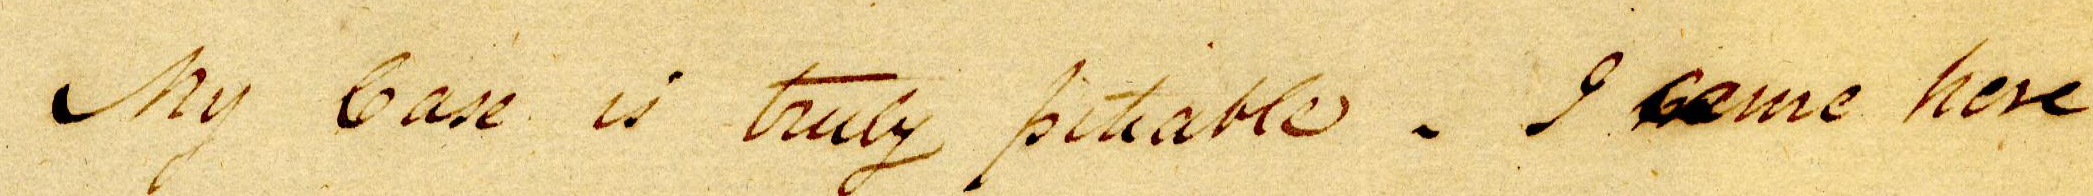My Case is truly pitiable. I came here
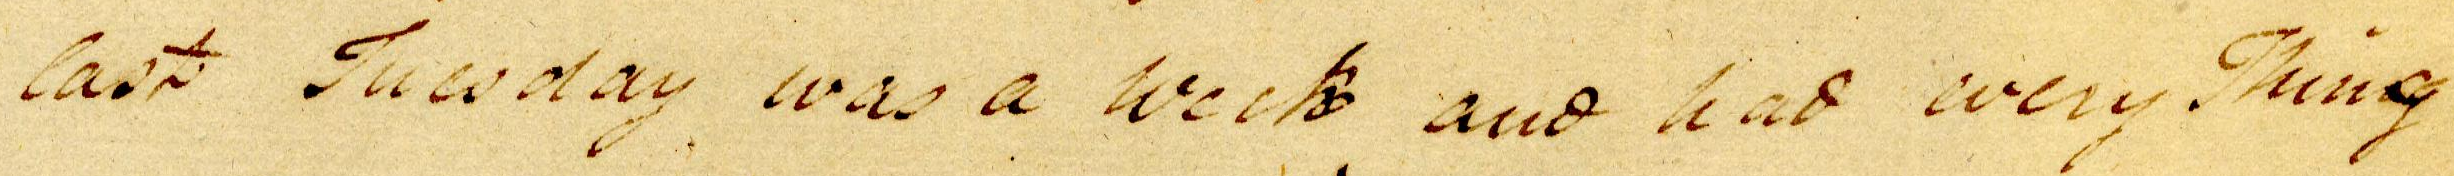last Tuesday was a week and had every Thing
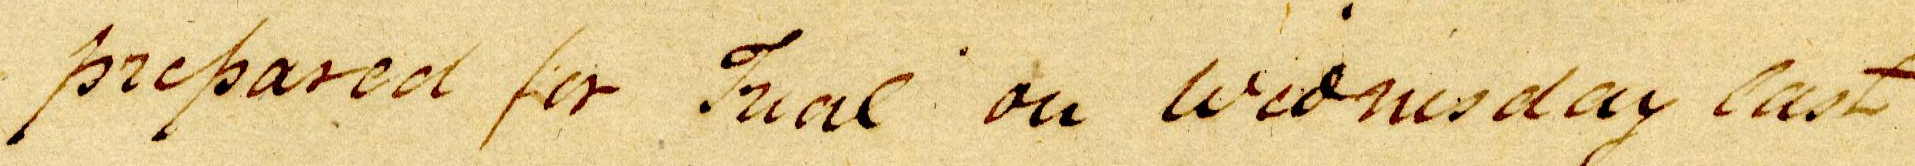prepared for Trial on Wednesday last
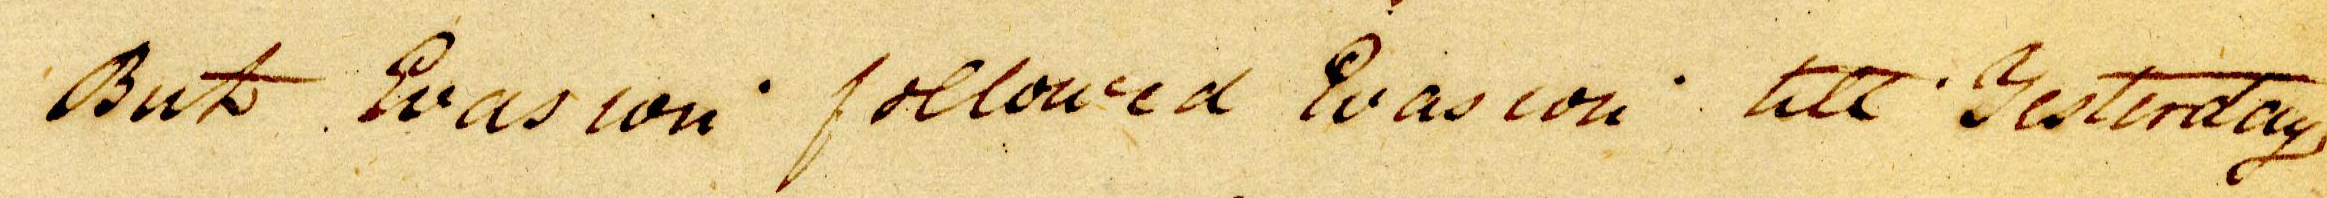But Evasion followed Evasion till Yesterday
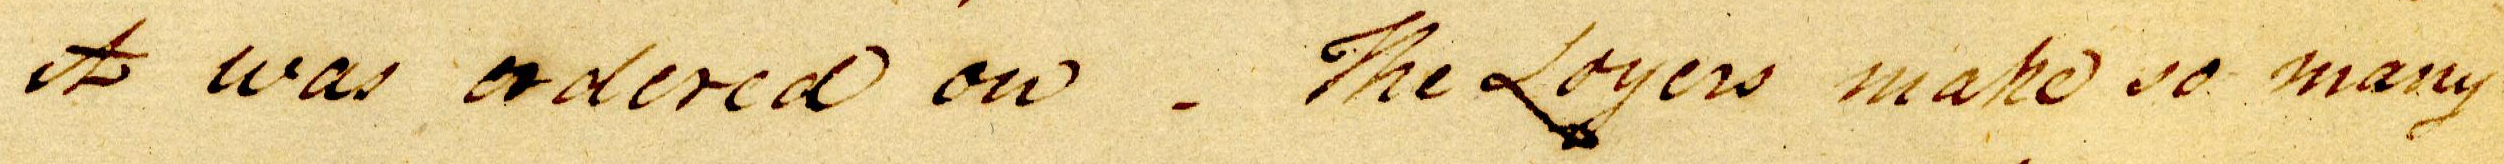it was ordered on. The Loyers make so many
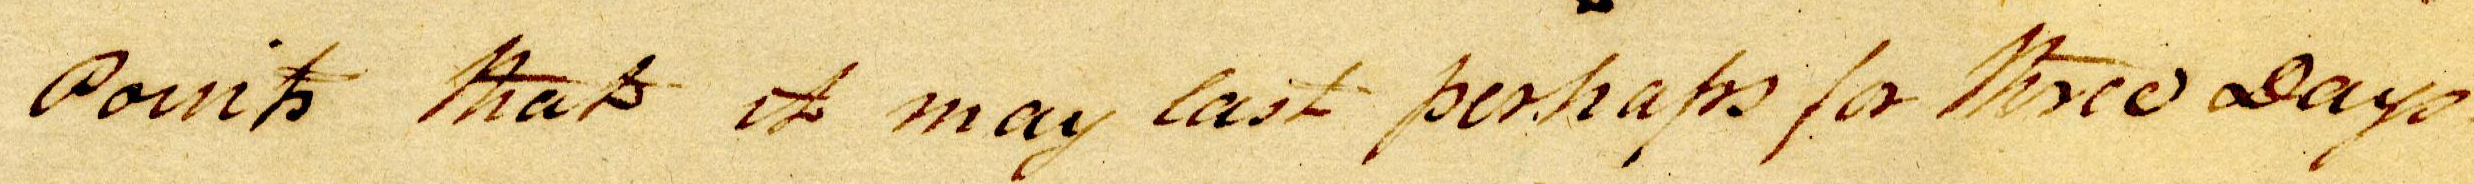Points that it may last perhaps for three Days
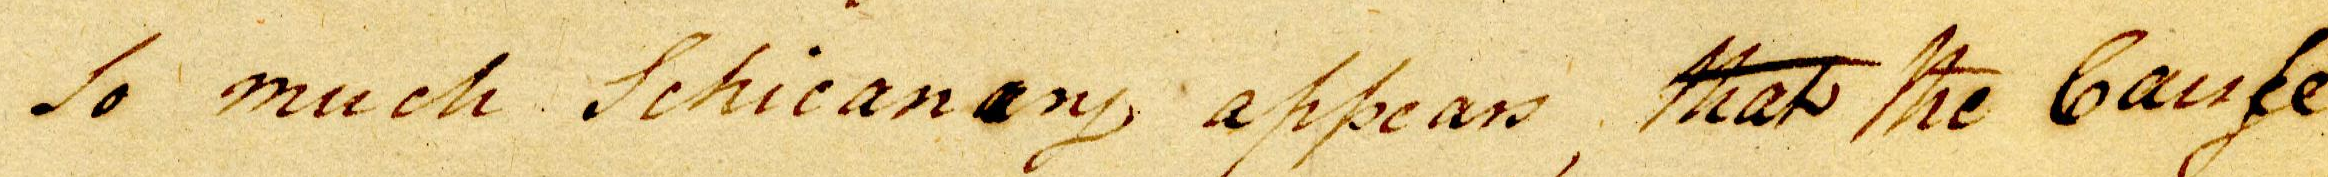So much Schicanary appears that the Cause
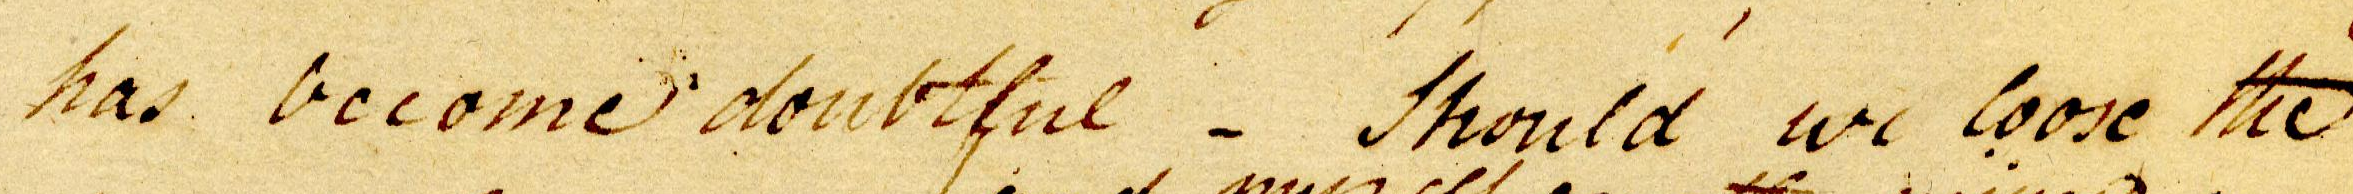has become doubtful. Should we loose the
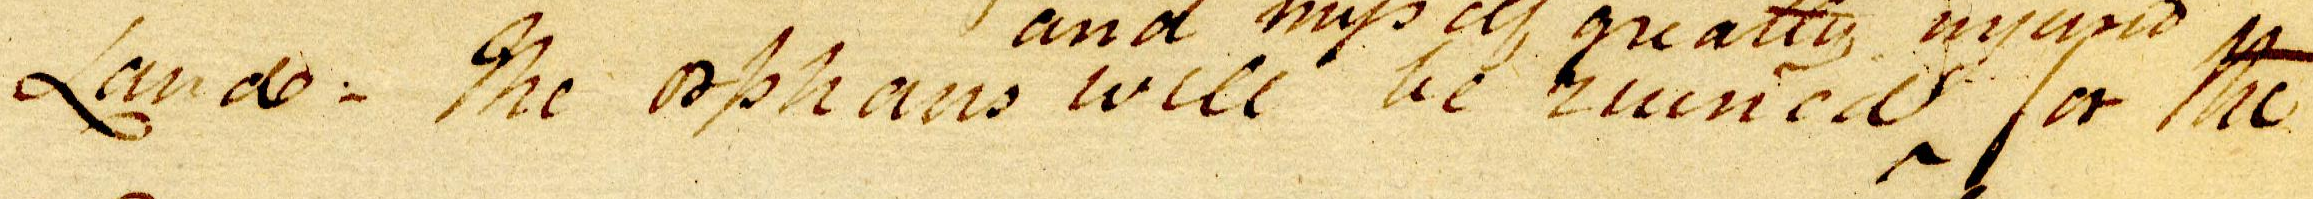Land. The orphans will be ruined ^ for the
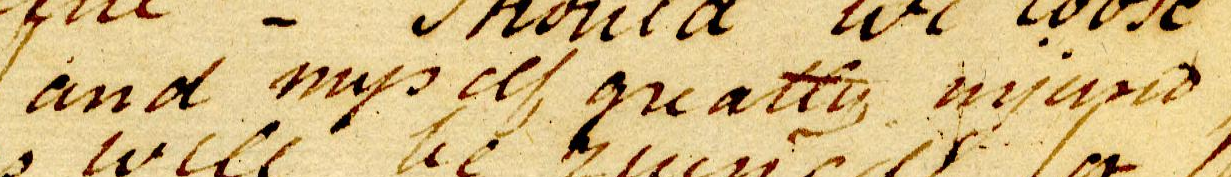and myself greatly injured
